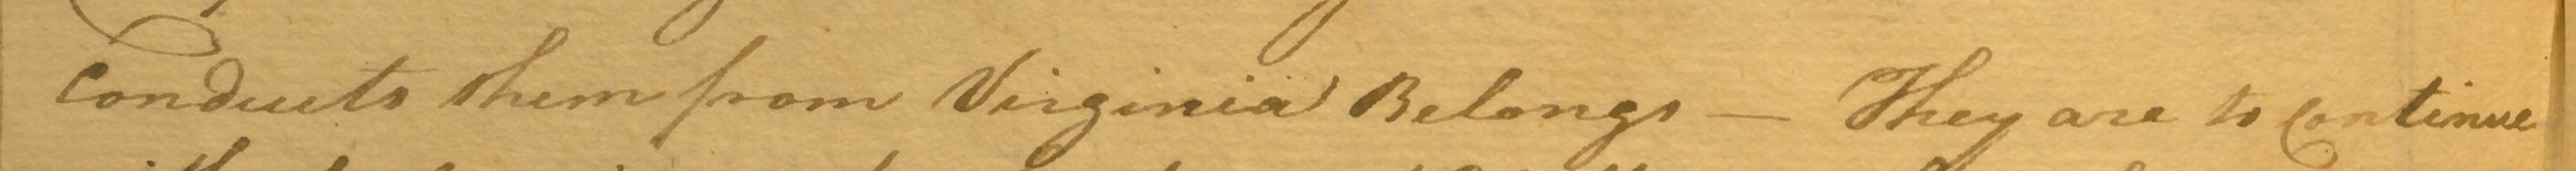conducts them from Virginia Belongs- They are to Continue
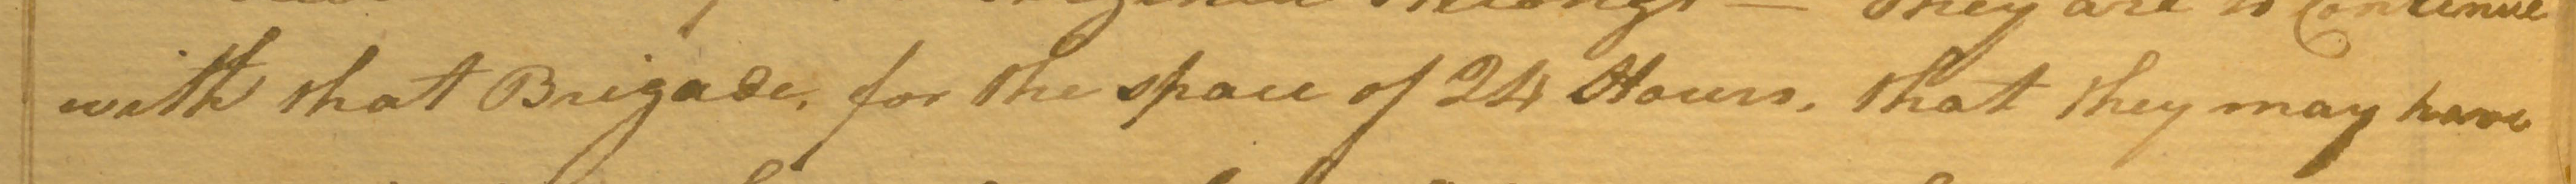with that Brigade for the space of 24 Hours that they may have
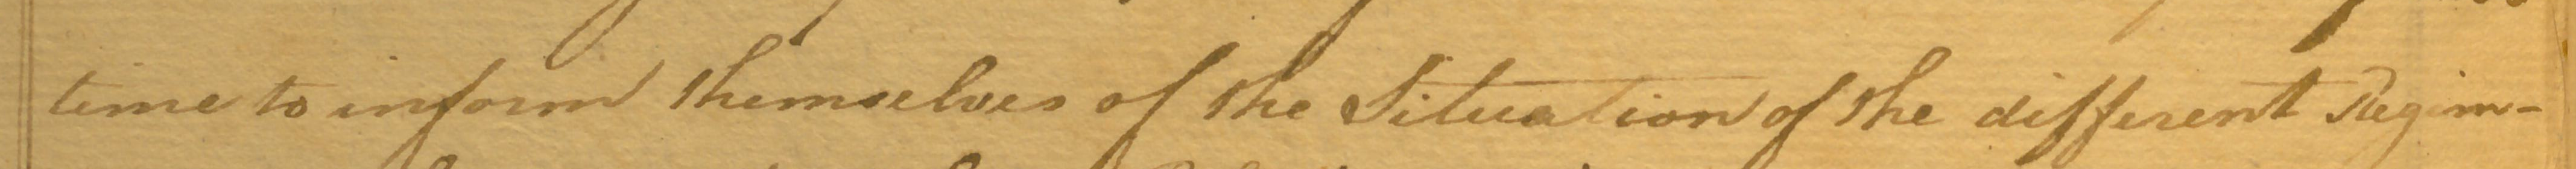time to inform themselves of the Situation of the different Regim-
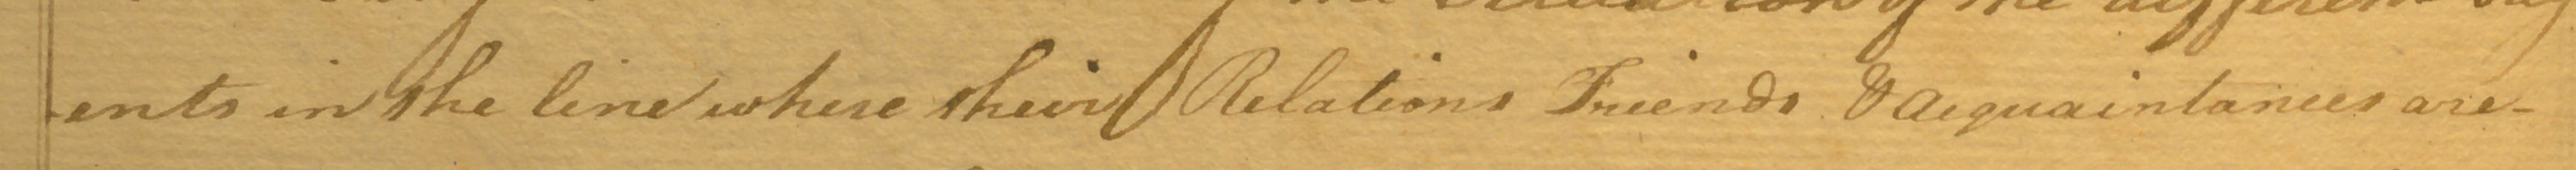-ents in the line where their Relations Friends & Acquaintances are
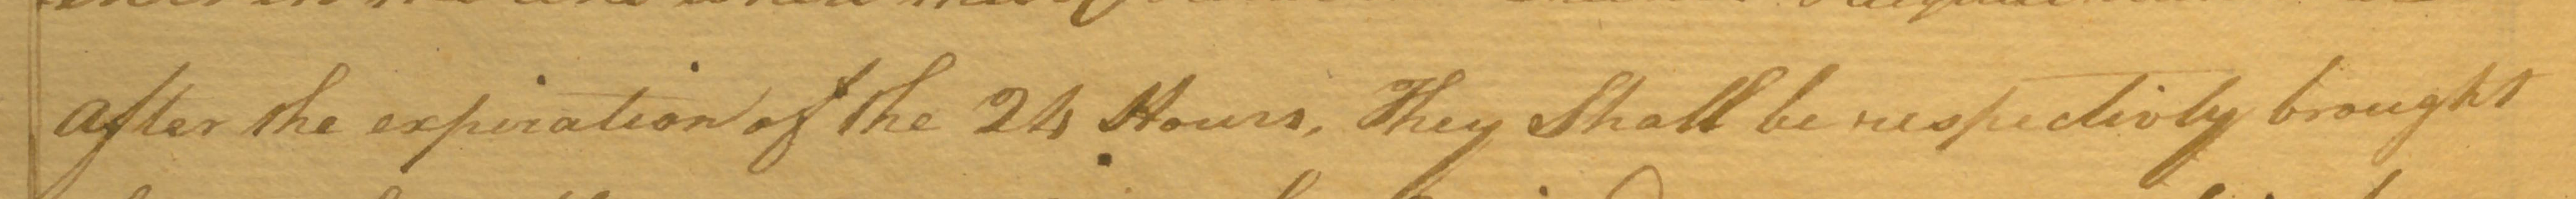after the expiration of the 24 Hours, They Shall be respectively brought
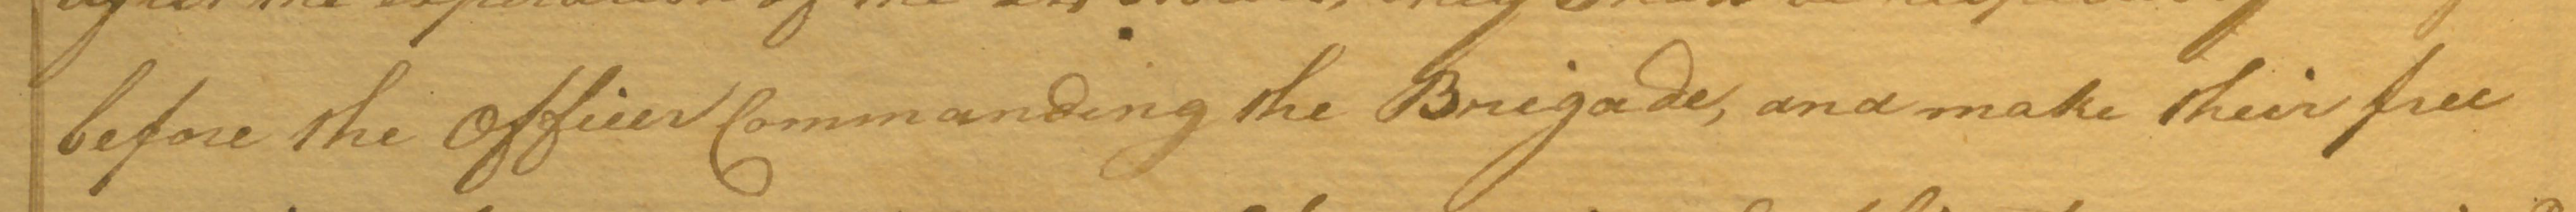before the Officer Commanding the Brigade, and make their free
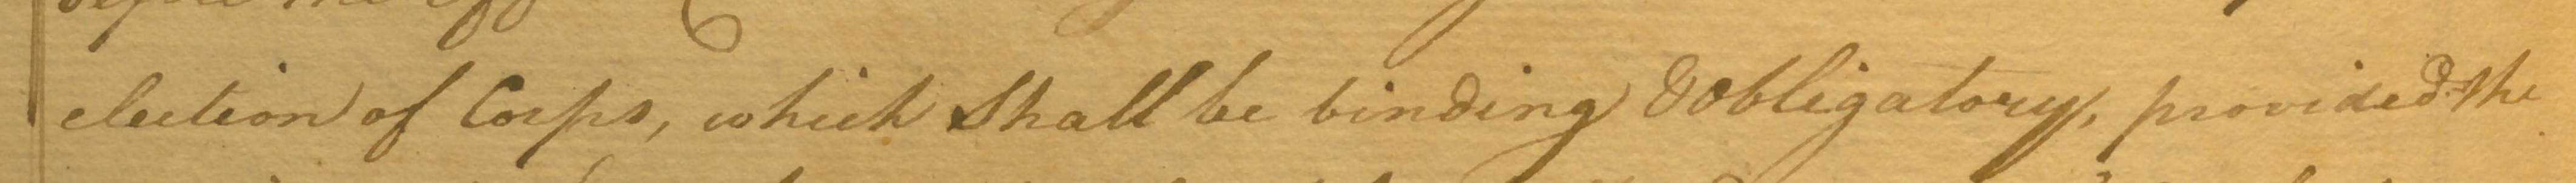election of Corps, which shall be binding & Obligatory, provided the
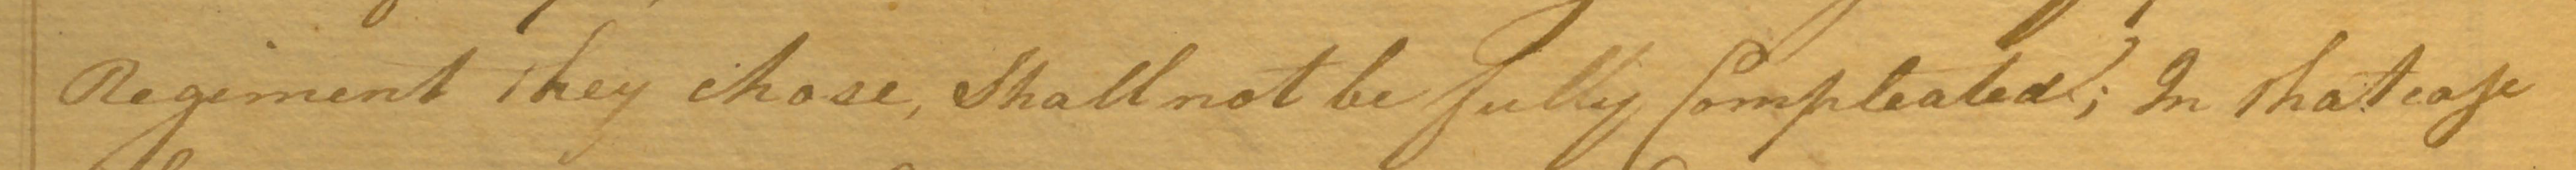Regiment they chose, shall not be fully Compleated; In that case
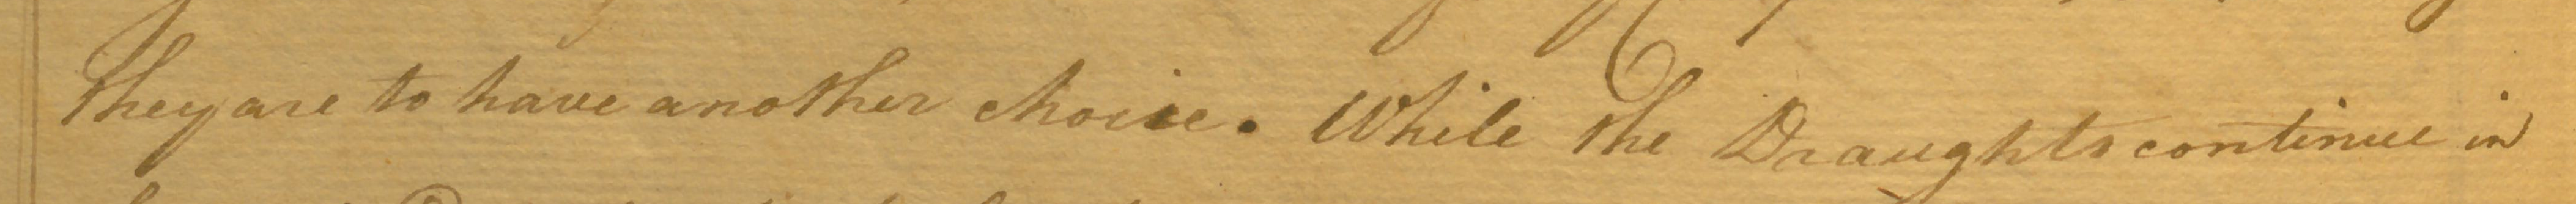they are to have another choice. While the Draughts continue in
